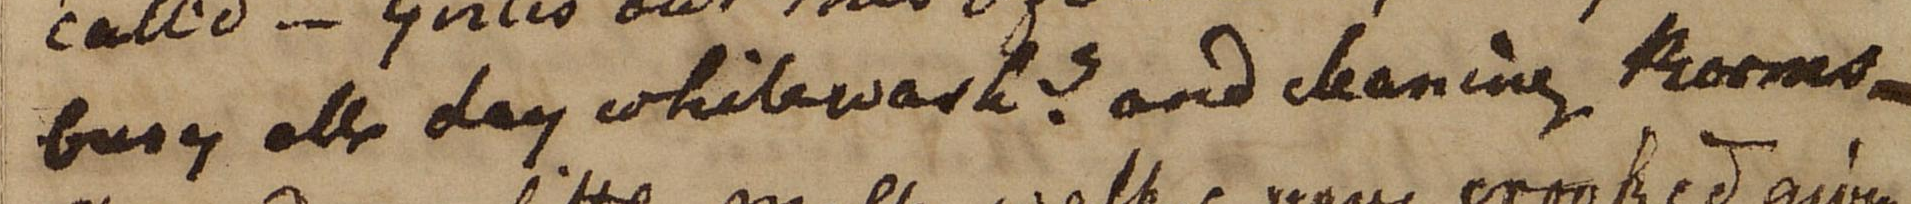busy all day whitewash^g. and cleaning Rooms-
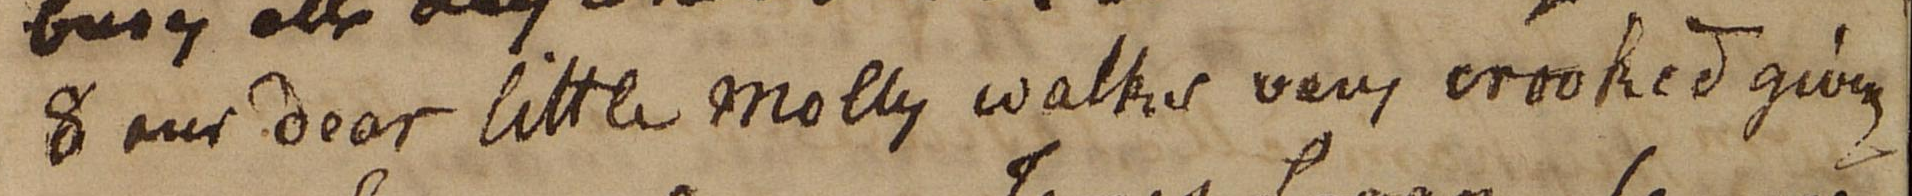8 our dear little Molly walks very crooked giving
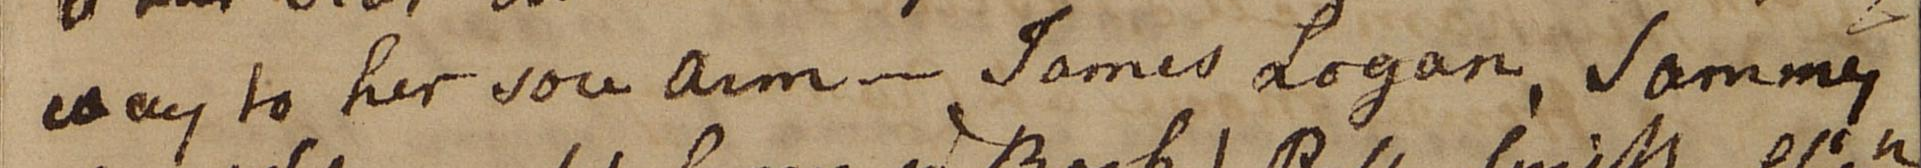way to her sore arm- James Logan, Sammy
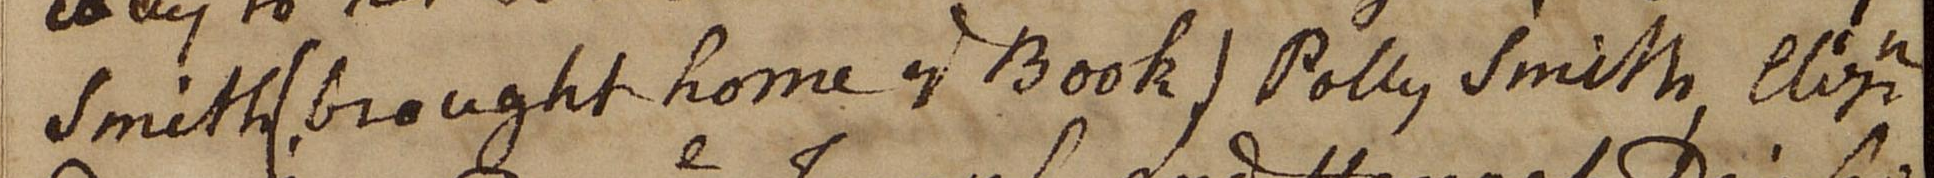Smith (brought home y^e Book) Polly Smith, Eliz^a.
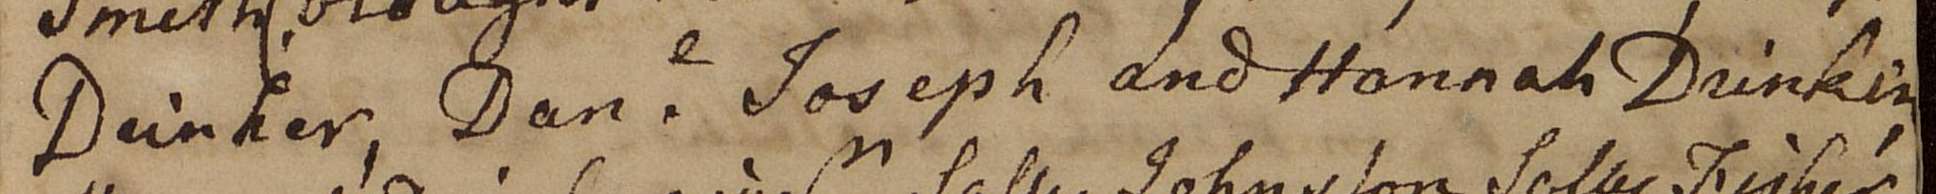Drinker, Dan^l. Joseph and Hannah Drinker,
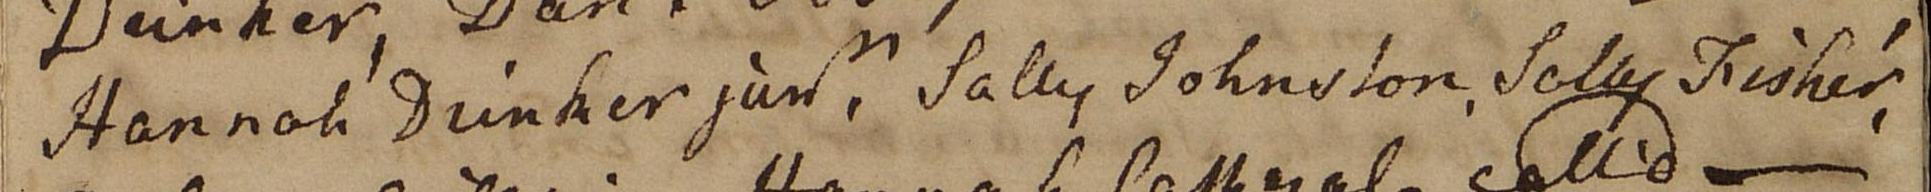Hannah Drinker jun^r. Sally Johnston, Sally Fisher,
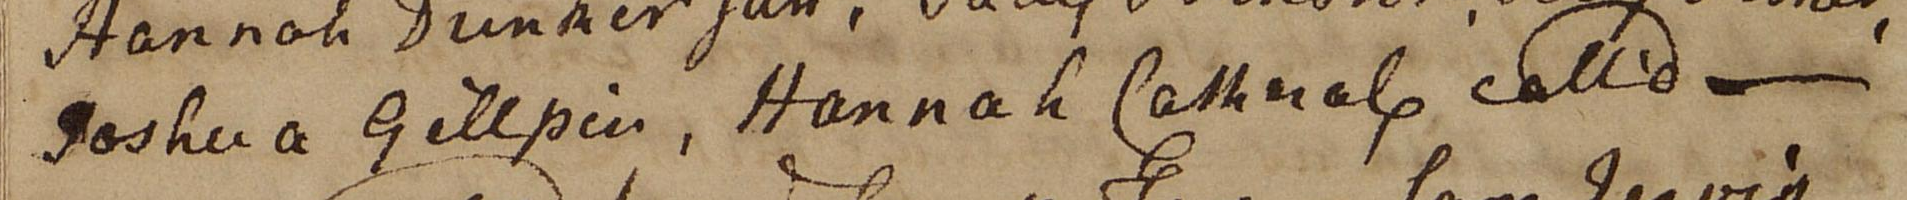Joshua Gillpin, Hannah Catheral call'd-
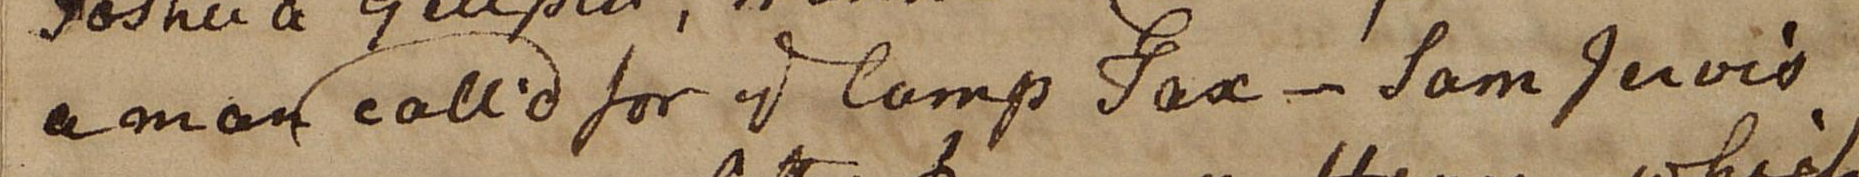a man call'd for y^e Camp Tax- Sam Jervis
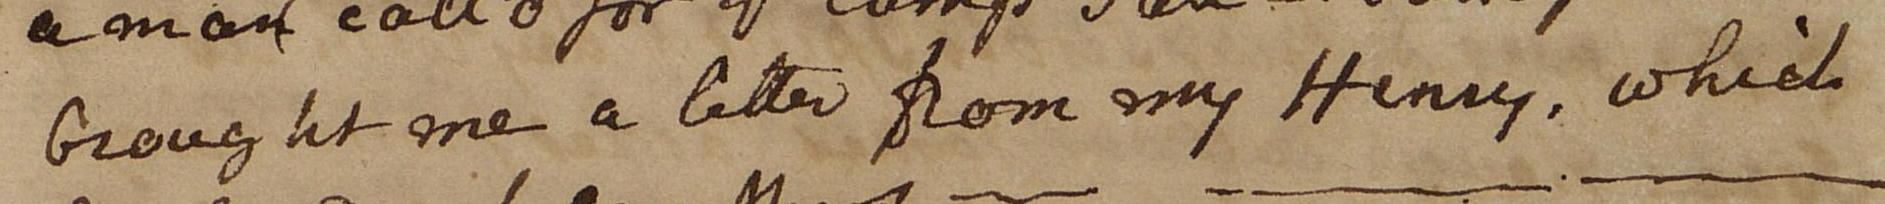brought me a letter from my Henry, which
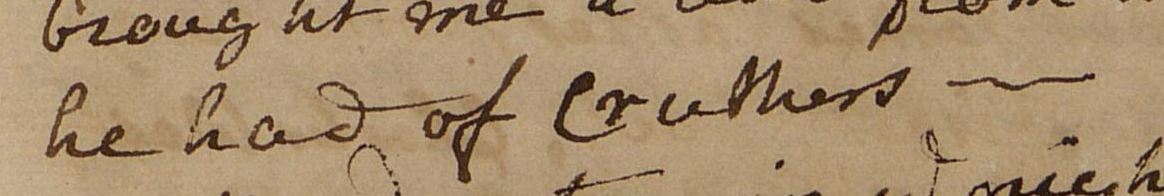he had of Cruthers-
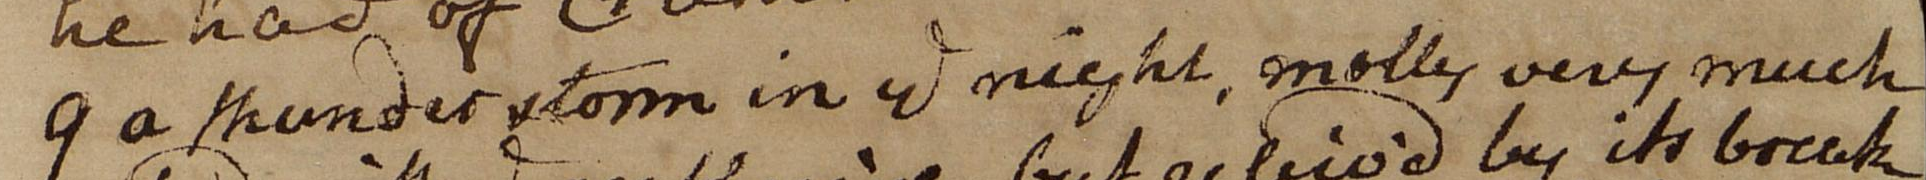9 a thunderstorm in y^e night, Molly very much
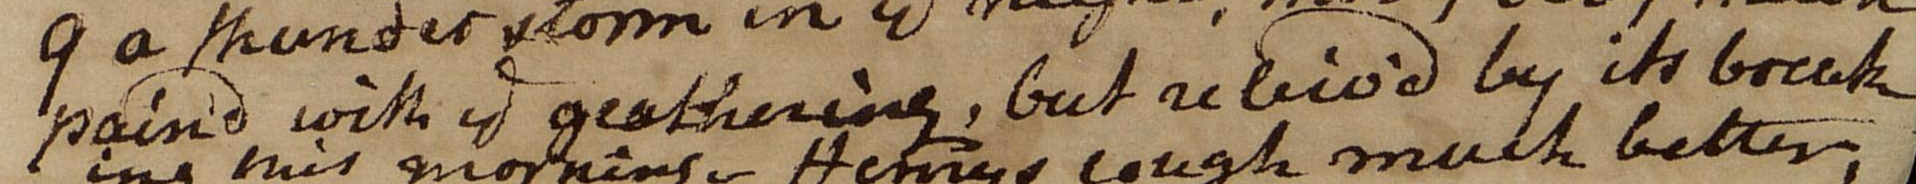pain'd with y^e geathening, but releiv'd by its break
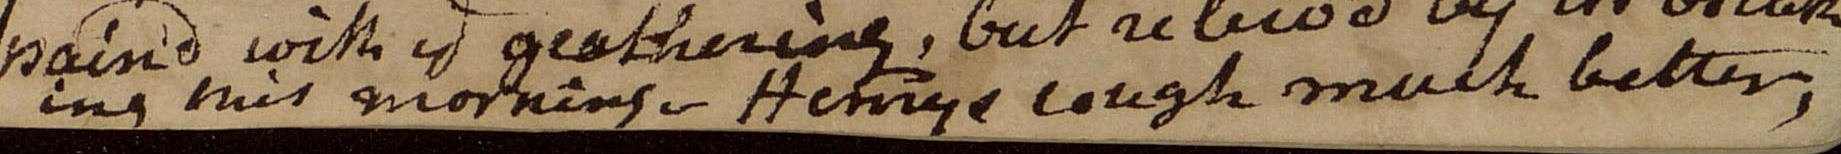ing mis morning- Henrys cough much better,
